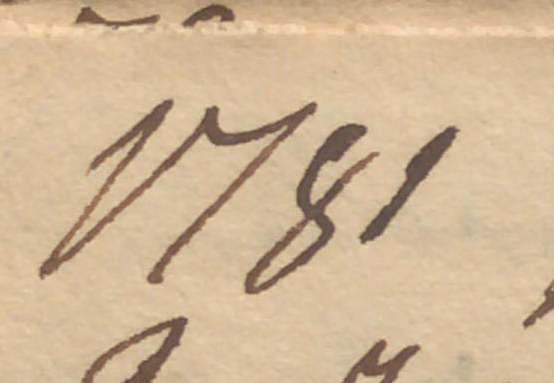1781
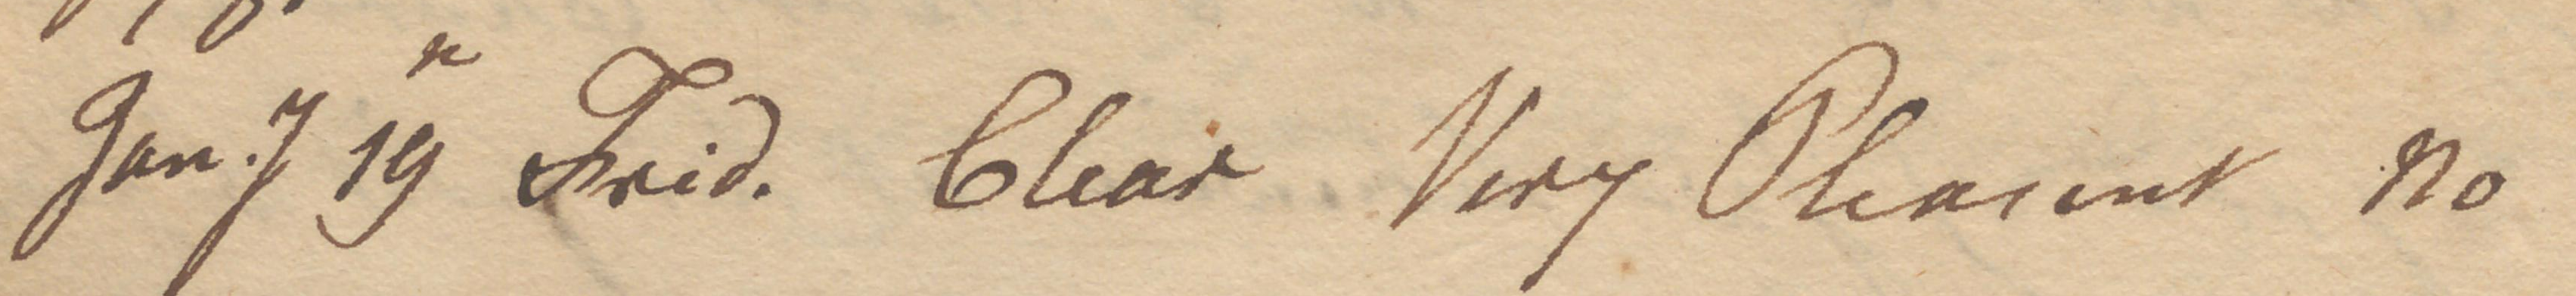Jan^y 19^th Frid. Clear Very Pleasent no
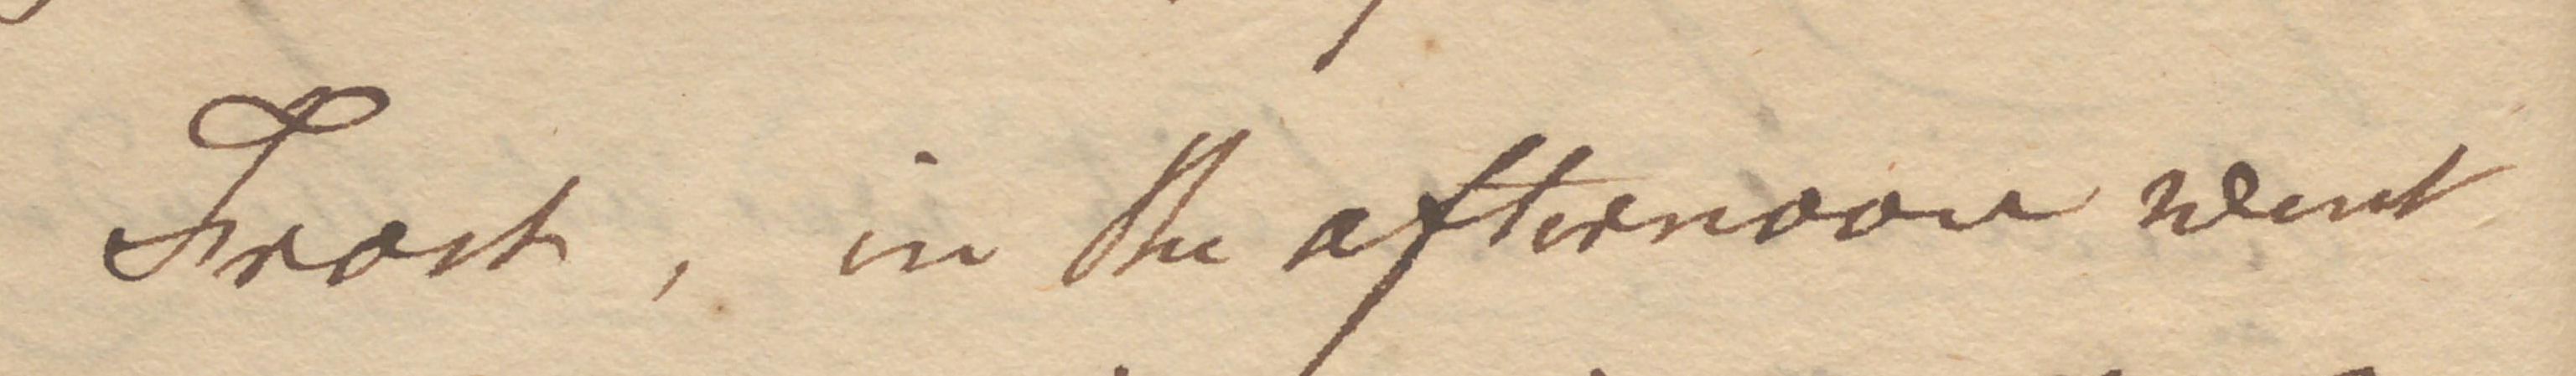Frost, in the afternoon went
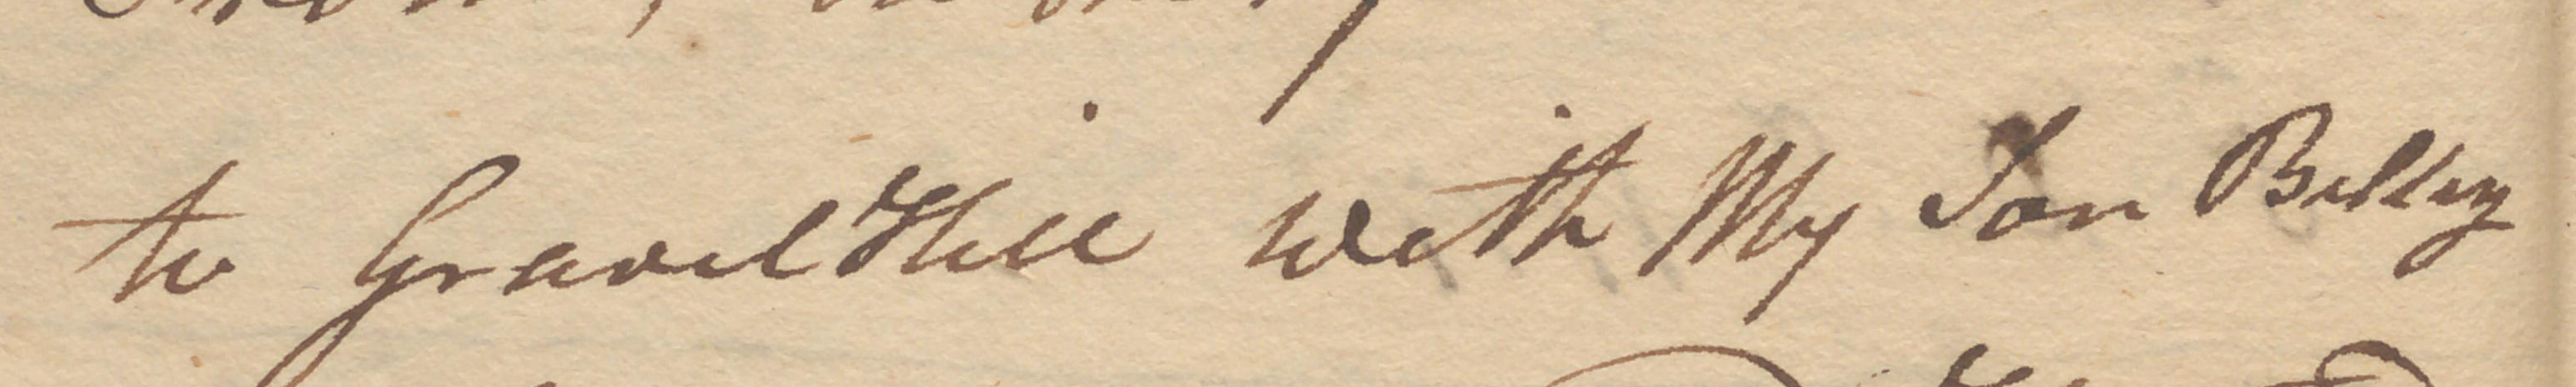to Gravel Hill with My son Billey
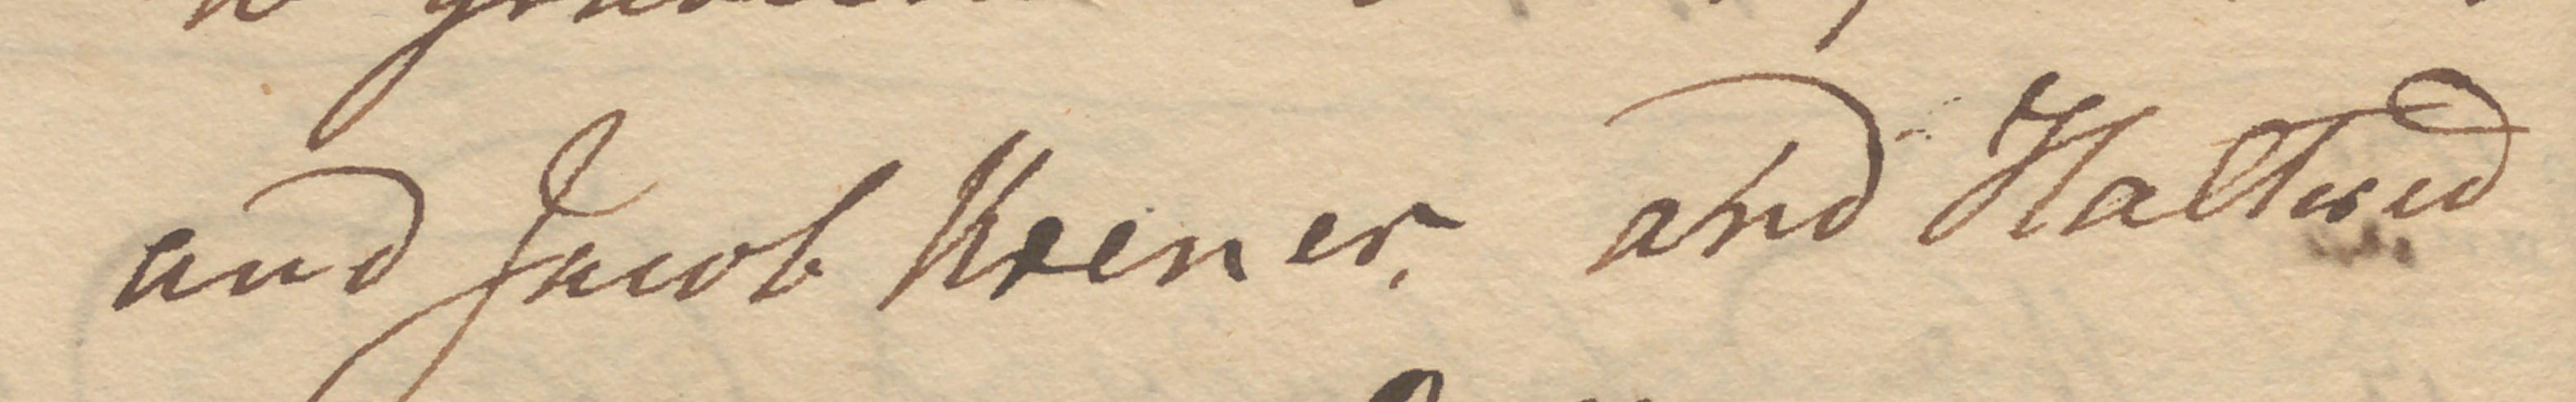and Jacob Krener, and Haltered
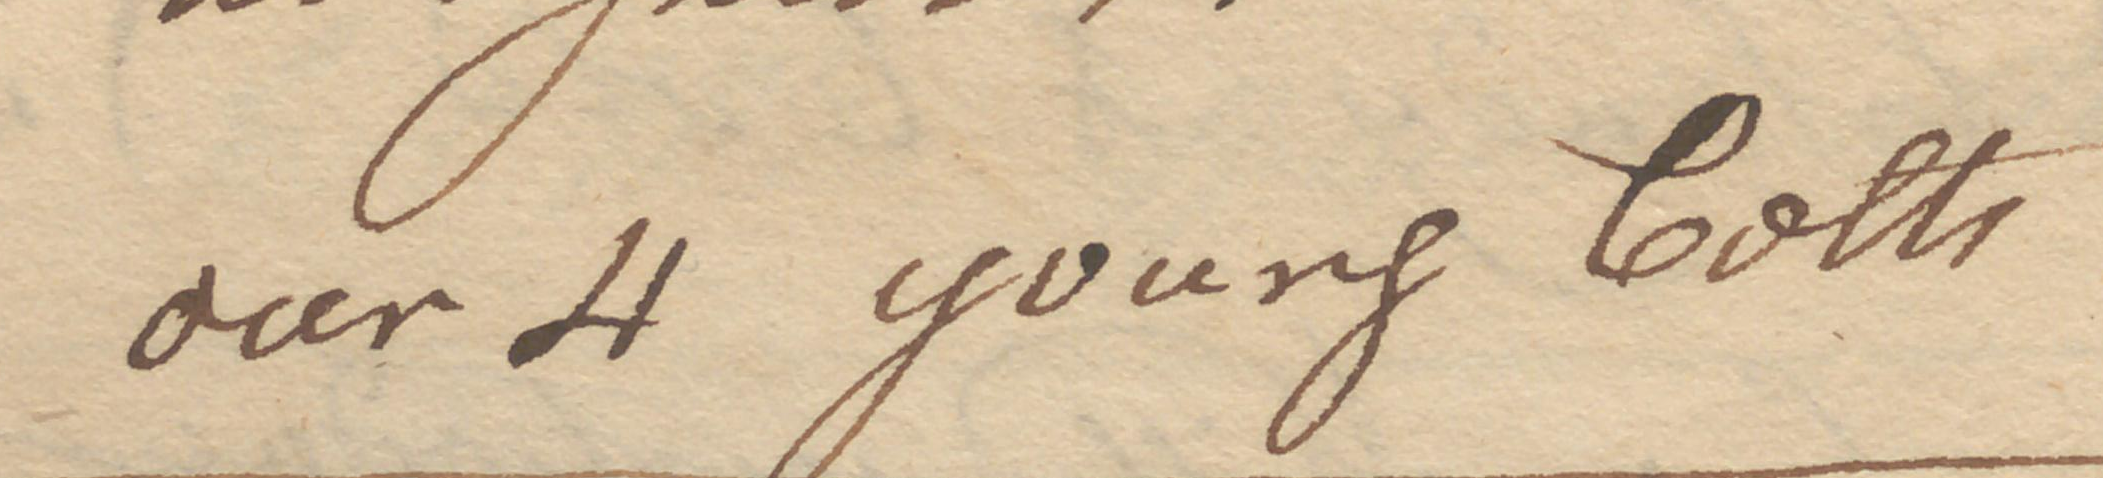our 4 young Colts
